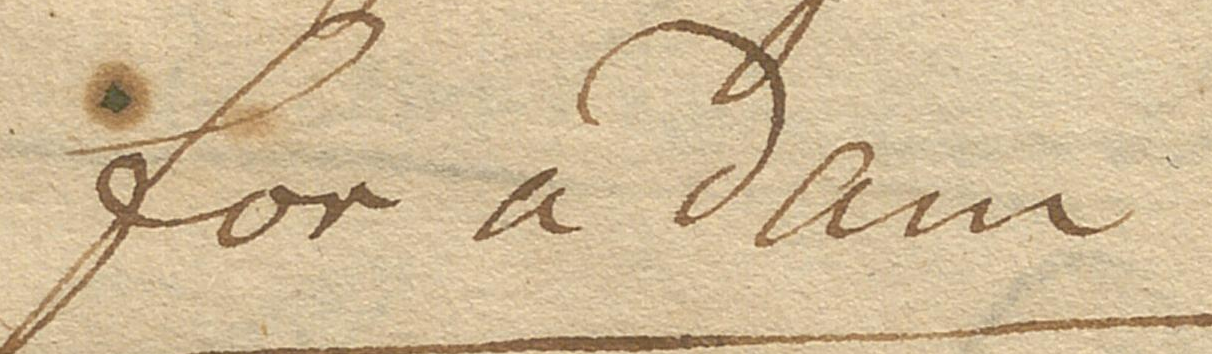for a dam
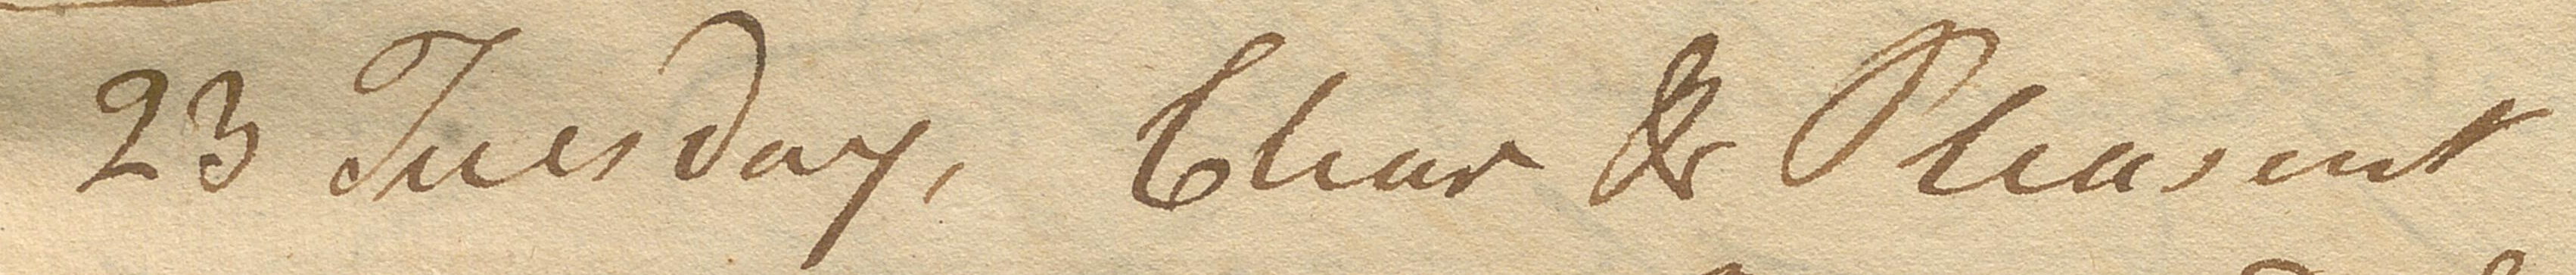23 Tuesday, Clear & Pleasent
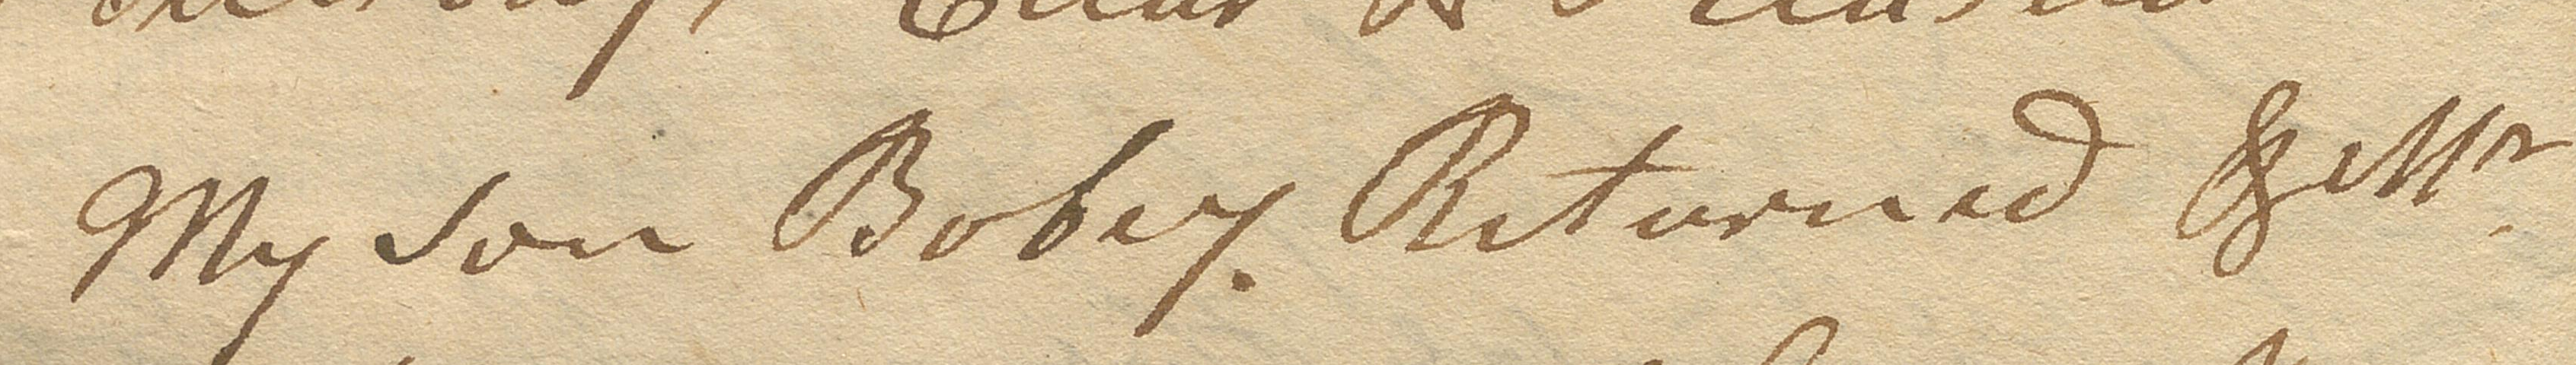My son Bobey Returned & M^r.
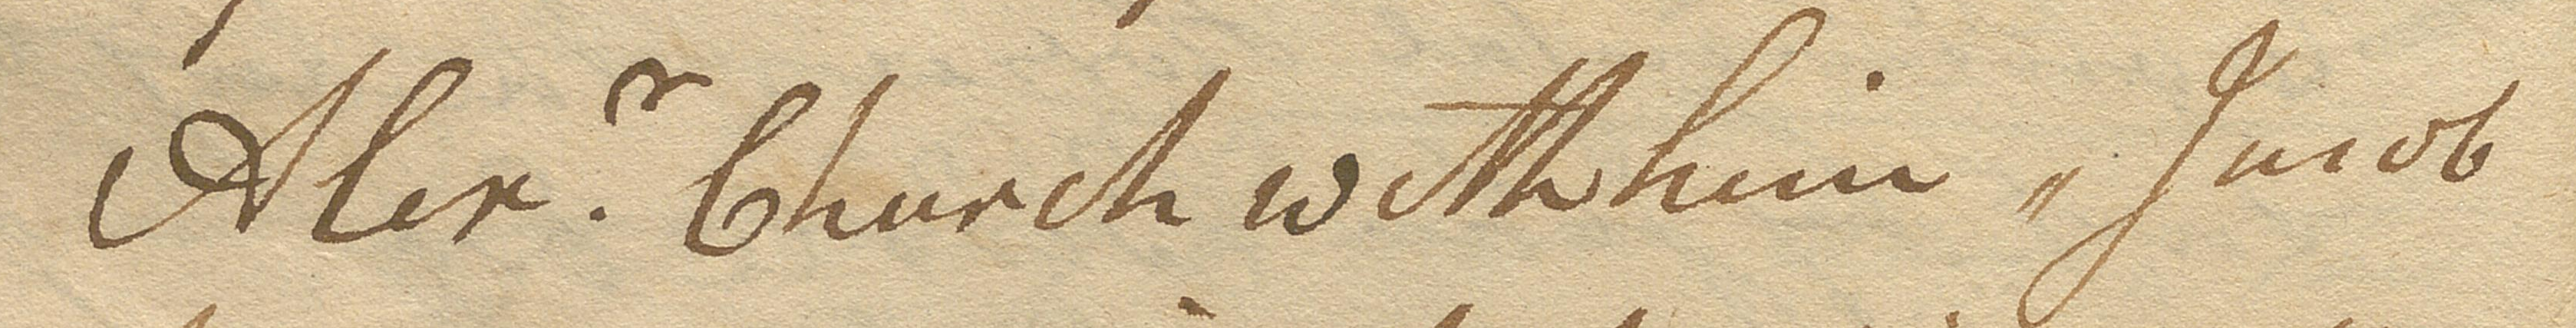Alex^r. Church with him, Jacob
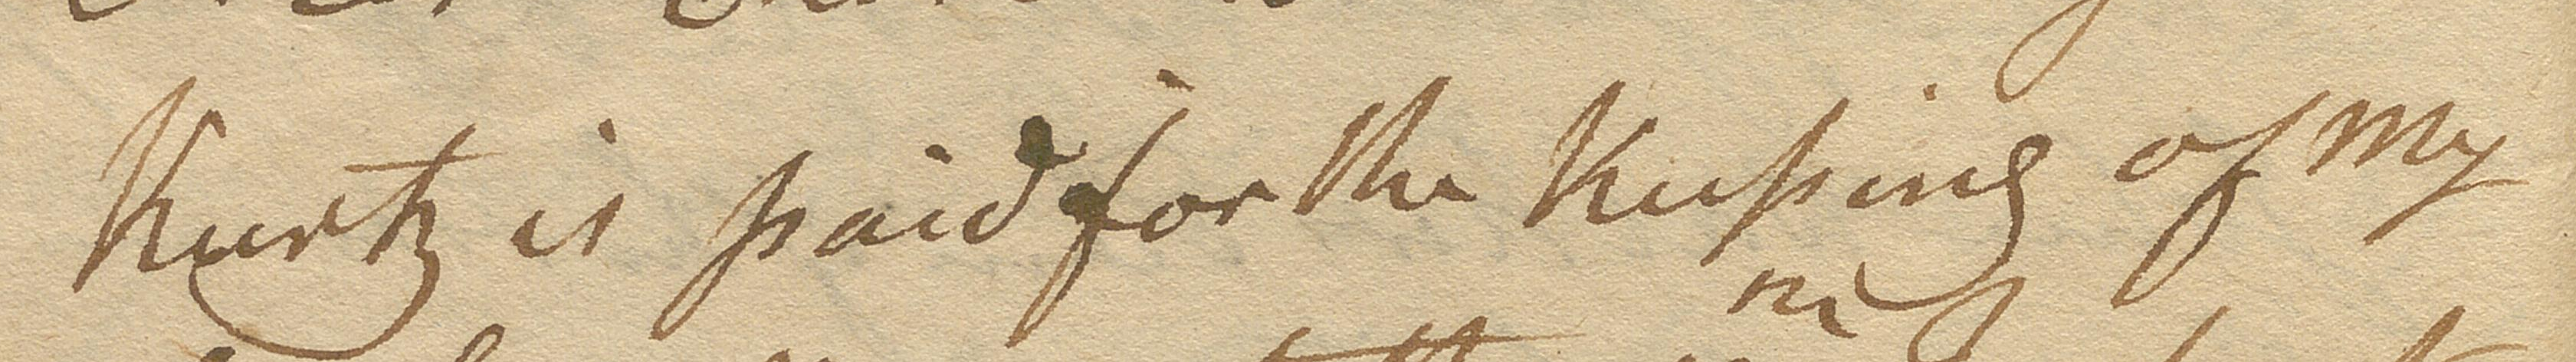Kurtz is paid for the Keeping of My
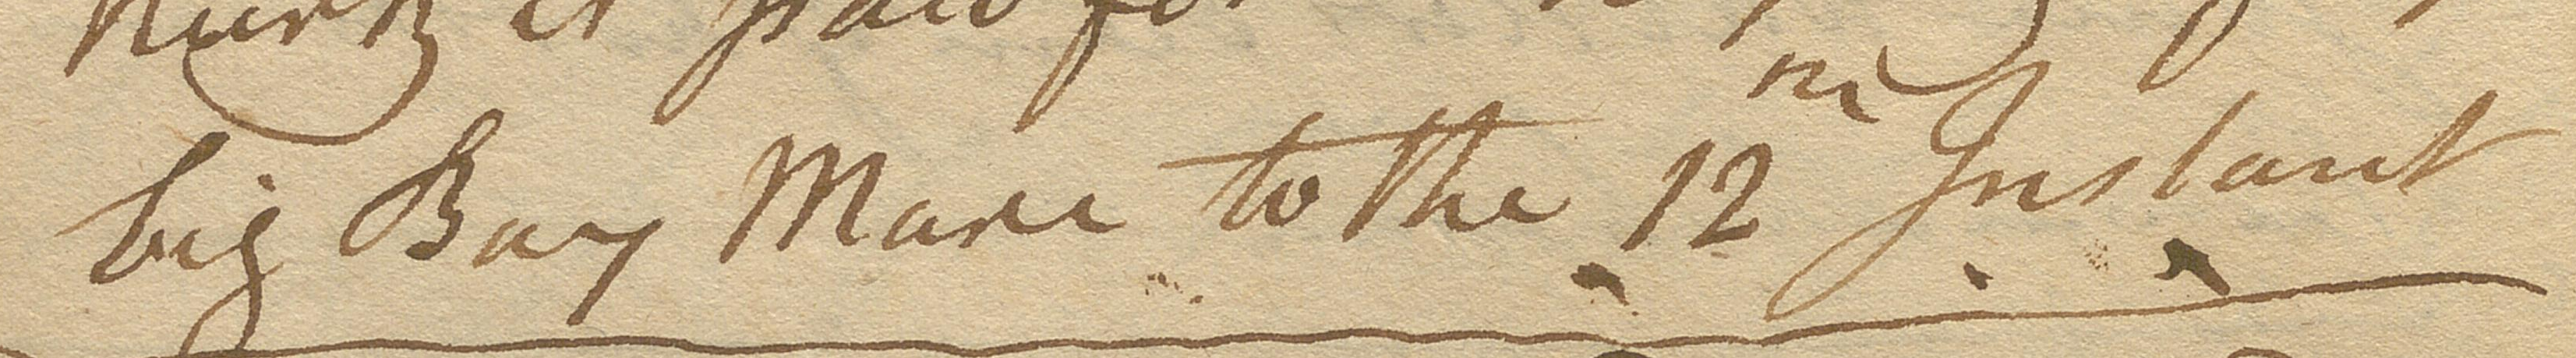beg Bay Mare to the 12^th Instant
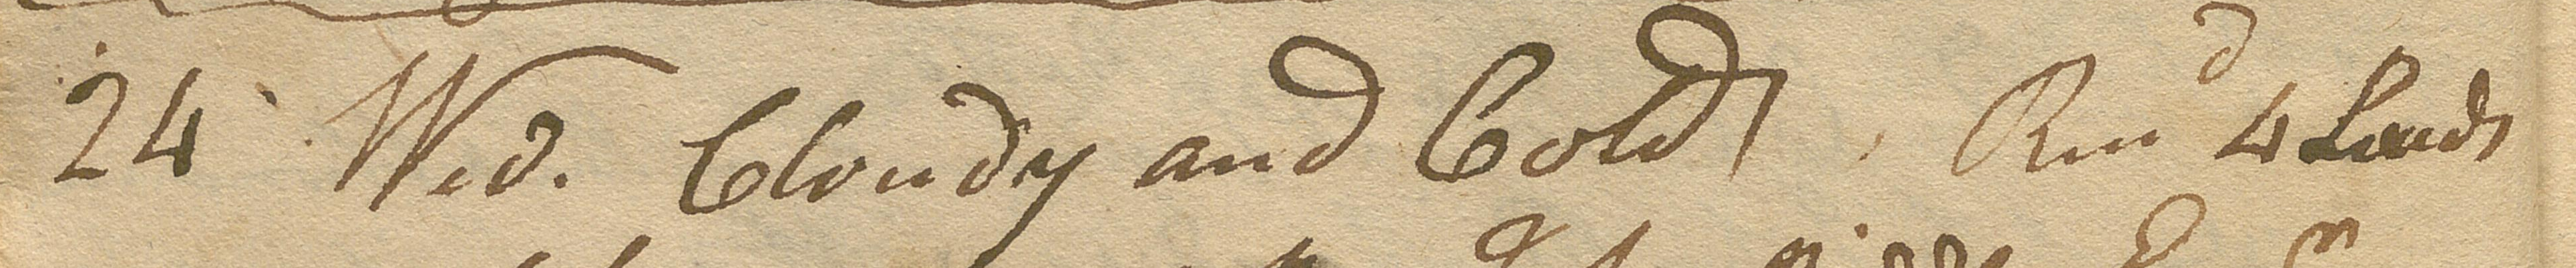24 Wed. Cloudy and Cold, Rec^d 4 Loads
